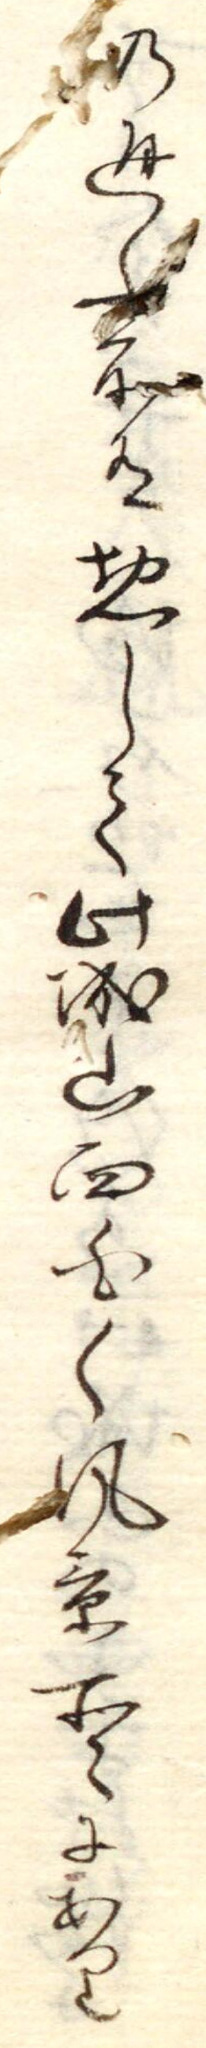の通ふ所有惣して此城山面白く風景所々にあり
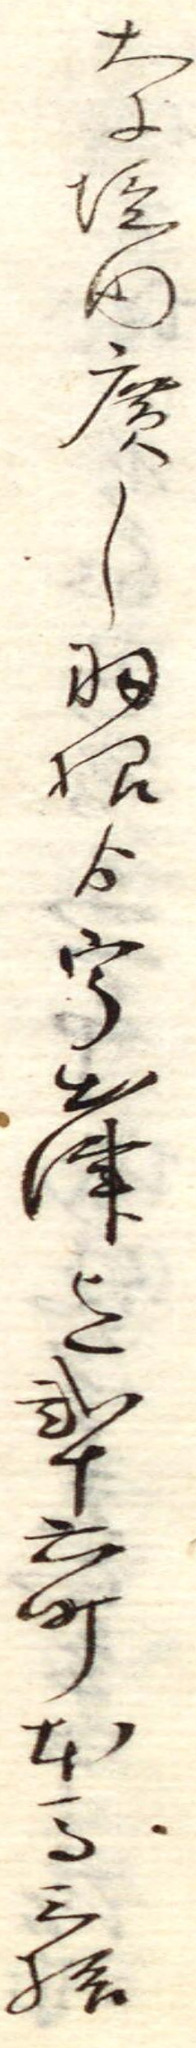大に境内広し羽根ゟ宇出津迄弐十六町本馬三拾
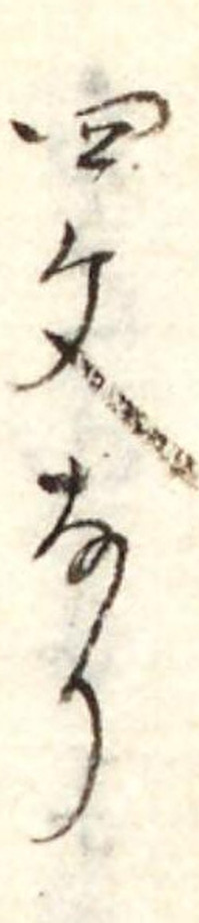四文なり
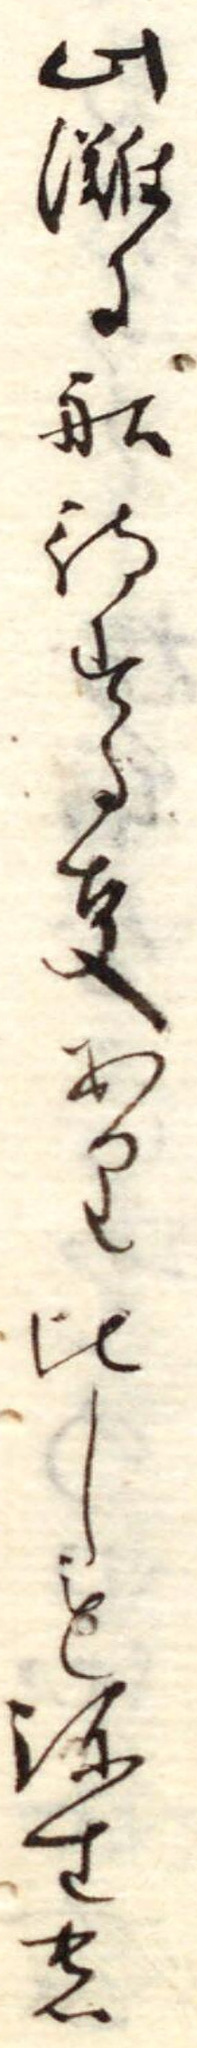此灘に船待する事あり比しこと珍重の
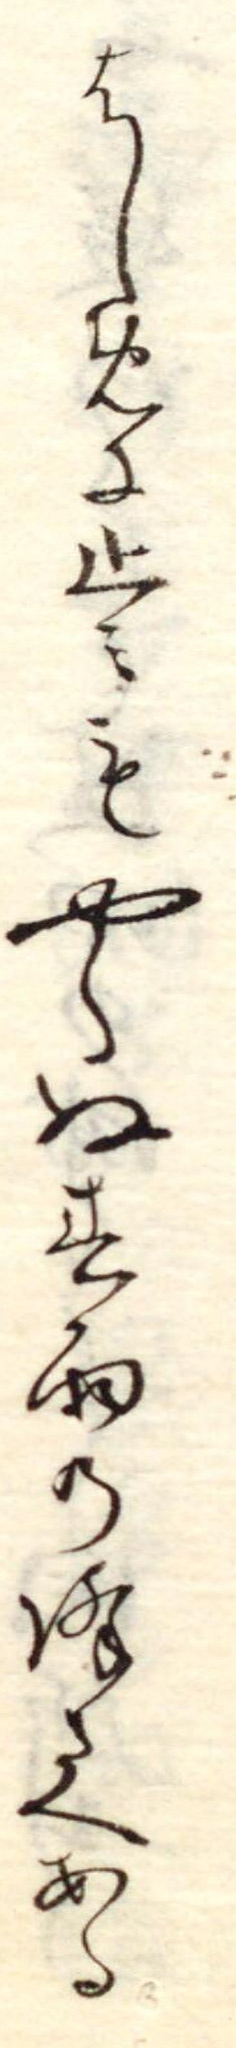はしめに止みもやらぬ春雨の降たへある
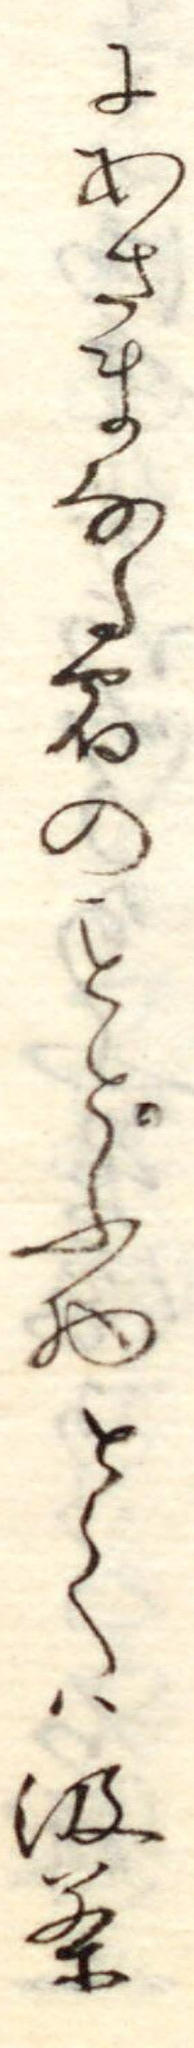にあさまなる宿のこととふ物とては汲茶
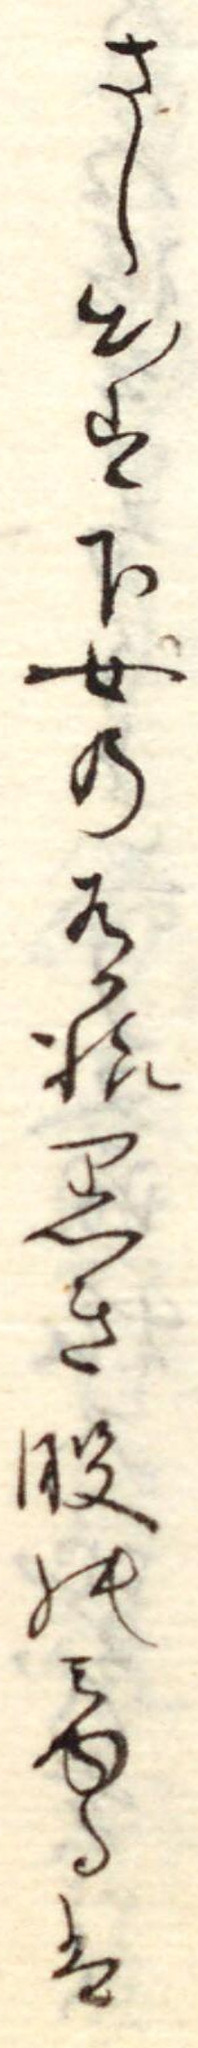さし出す下女の有か様黒き股のみゆるは
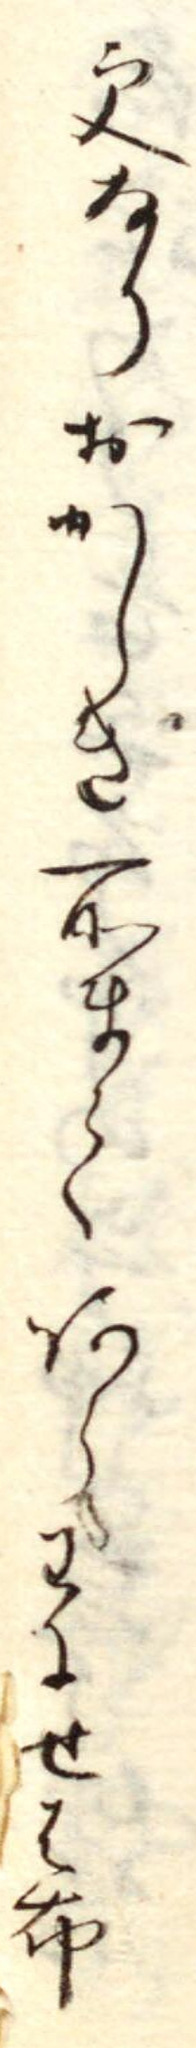更なりおかしき所まてあらわにせは布
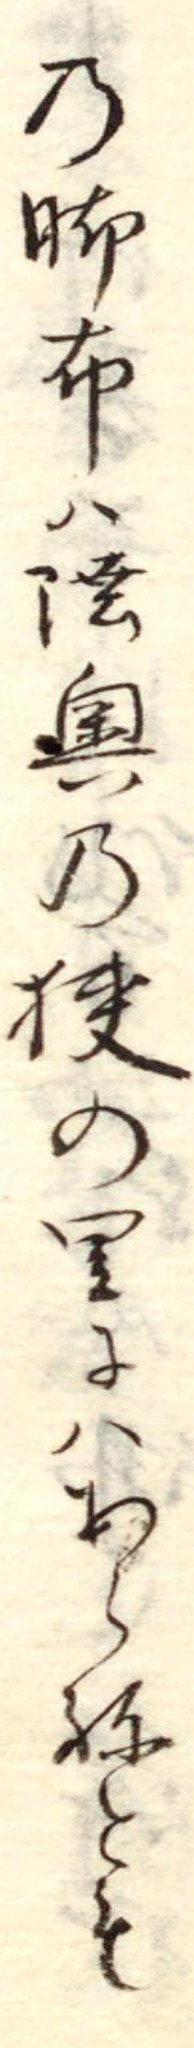の脚布は陸奥の狭の里にはあらねとも
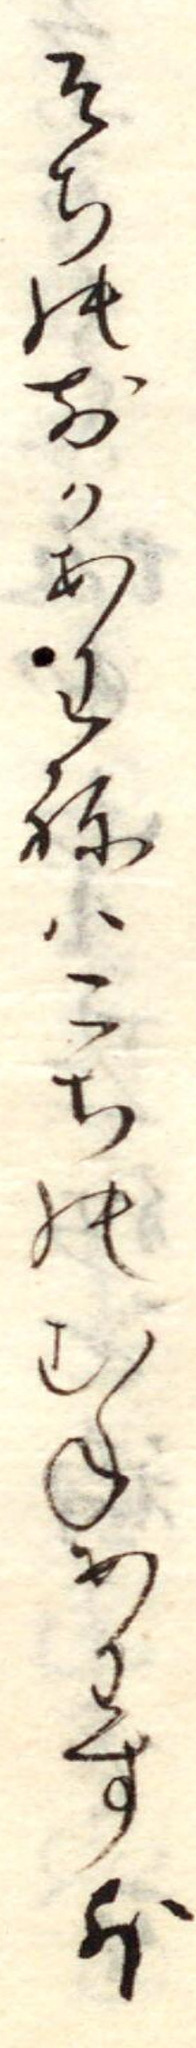そちの前かあわねはこちのむねあわす外
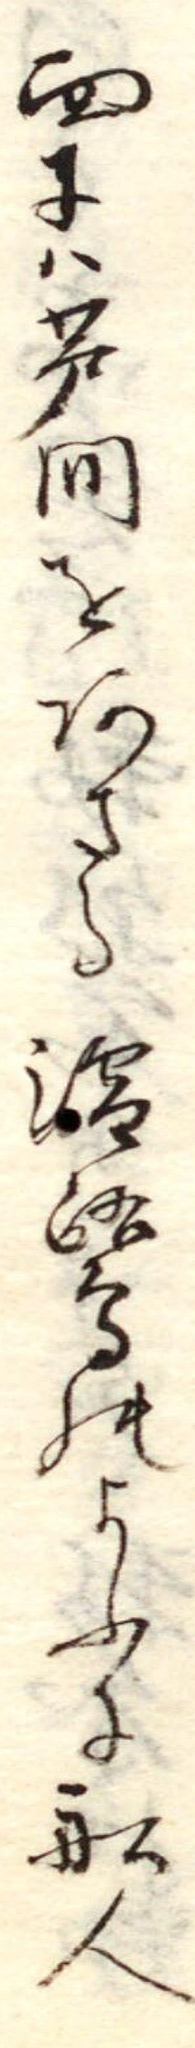面には芦間をあさる濡鷺のよふに船人
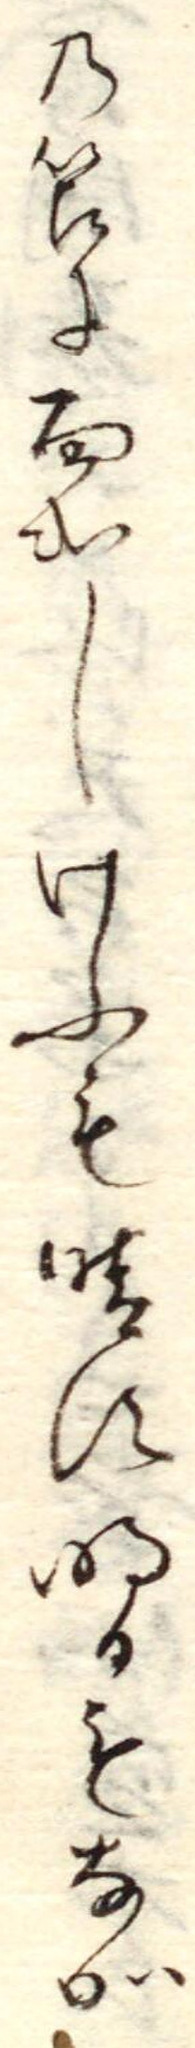の筈に面出しけふも晴す明日もなか
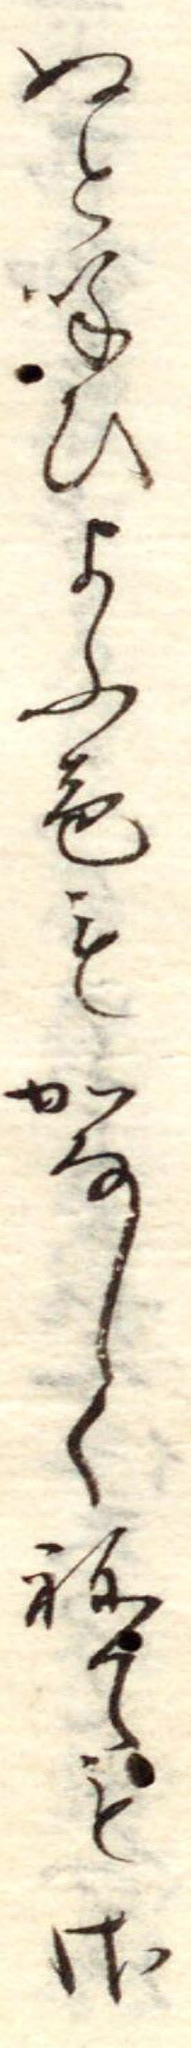ぬと呼ひよふ声もかなしくねてもさ
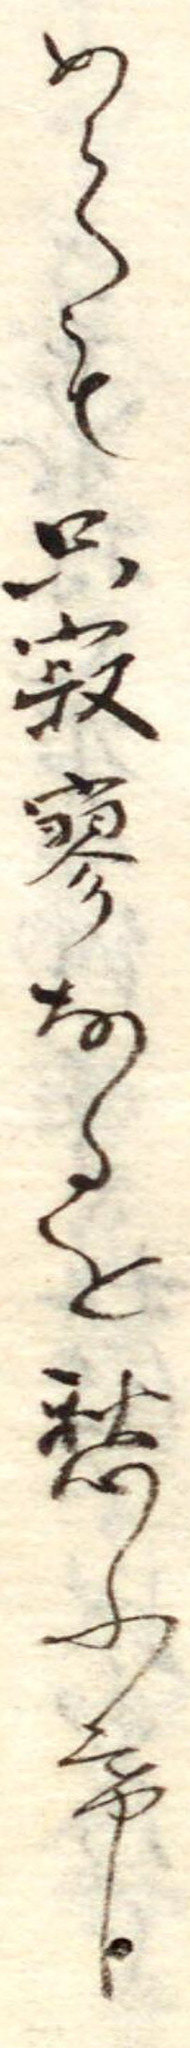めても只寂寥なるを愁ふけし
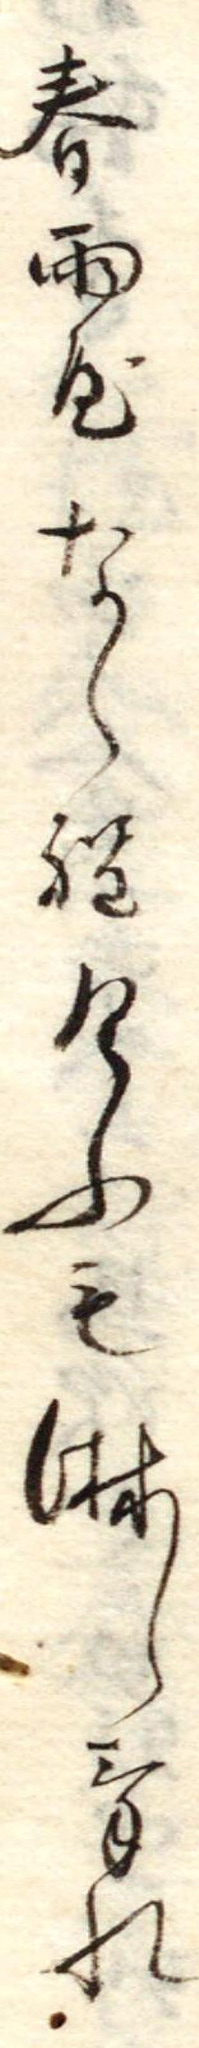春雨やなく程けふも淋しけれ
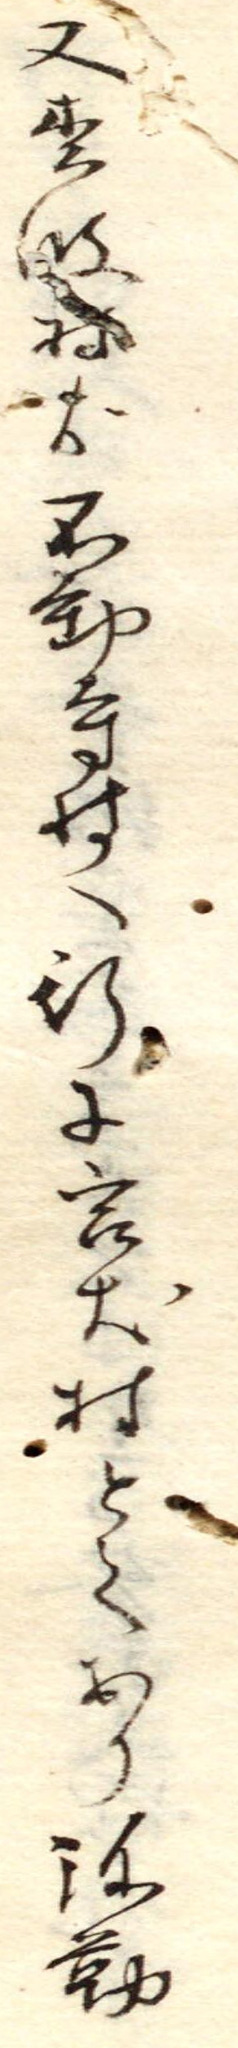又枩波村ゟ不動寺村へ行に宮犬村とてあり弥勒
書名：能登名跡誌
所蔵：Ishikawa Prefectural Library
